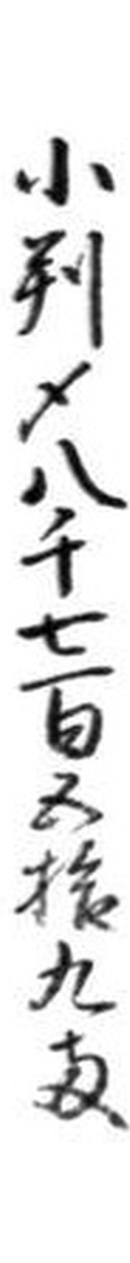小判〆八千七百五拾九両
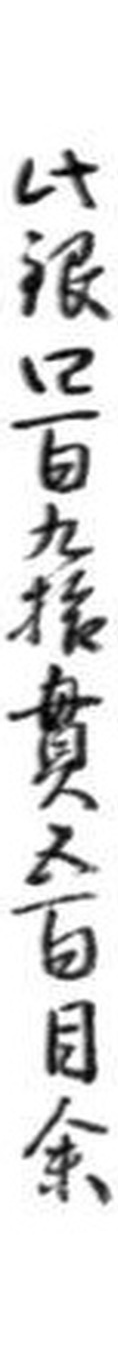此銀四百九拾貫五百目余
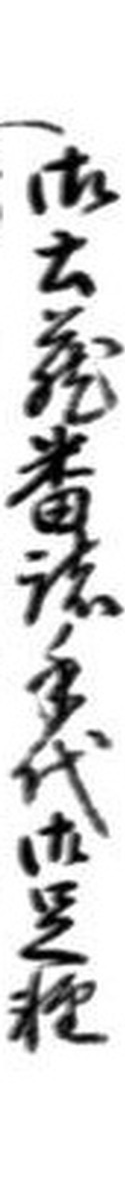御土蔵番諸手代御足軽
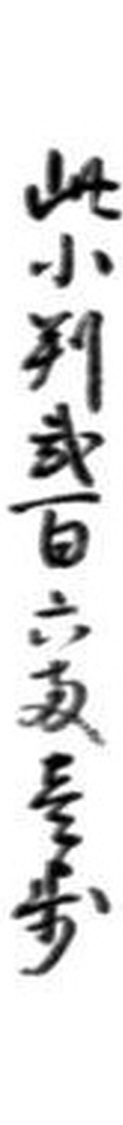此小判弐百六両壱歩
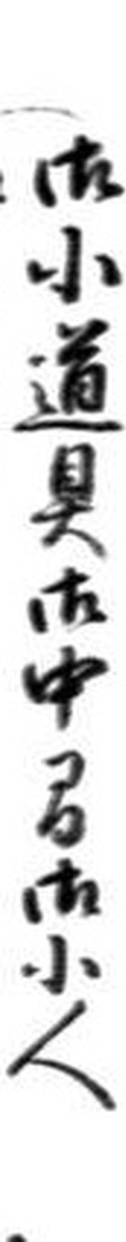御小道具御中間御小人
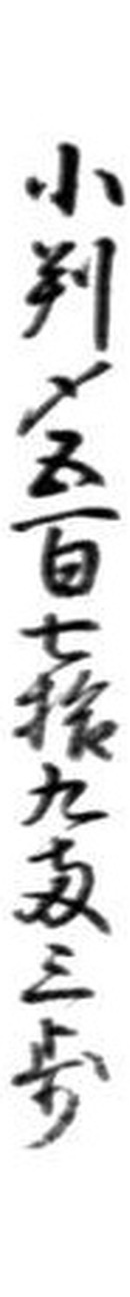小判〆五百七拾九両三歩
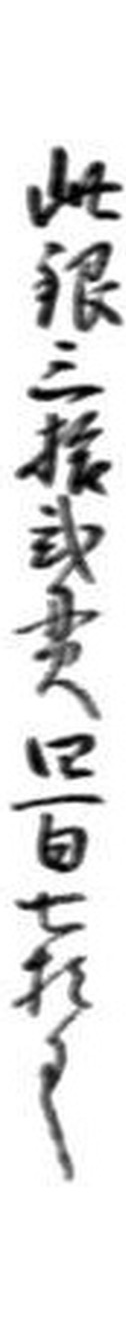此銀三拾弐貫四百七拾匁
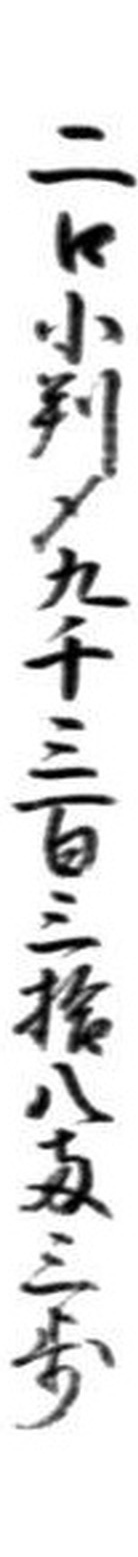二口小判〆九千三百三拾八両三歩

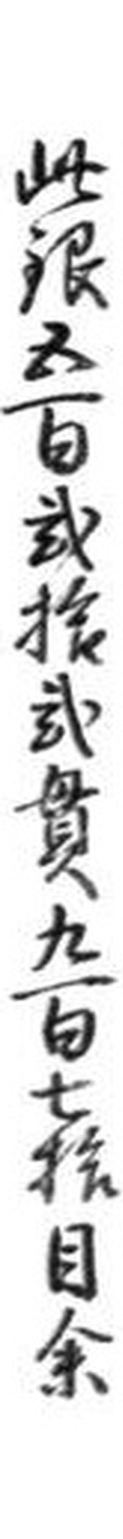此銀五百弐拾弐貫九百七拾目余
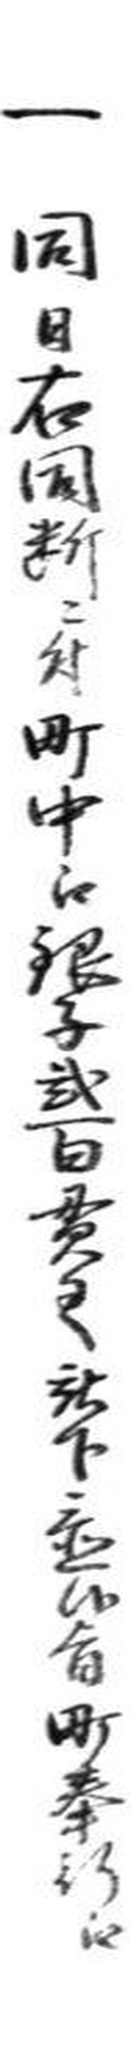一同日右同断ニ付町中江銀子弐百貫匁被下置候旨町奉行江
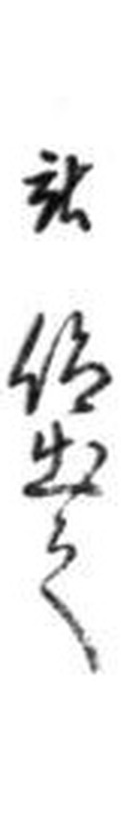被仰出之
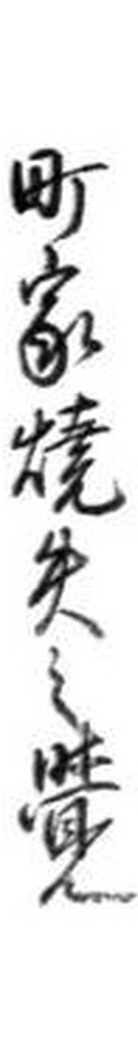町家焼失之覚
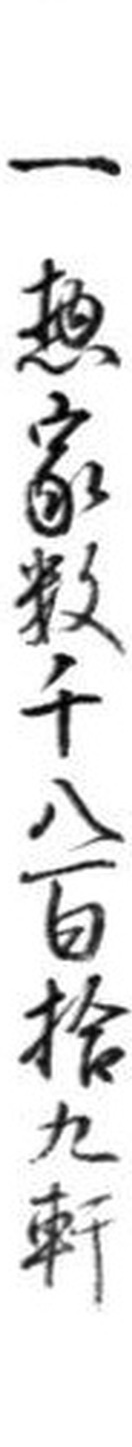一惣家数千八百拾九軒
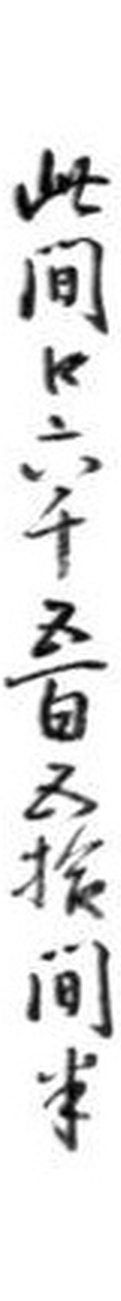此間口六千五百五拾間半
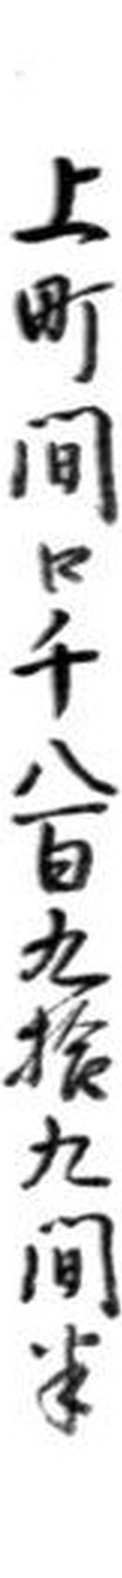上町間口千八百九拾九間半
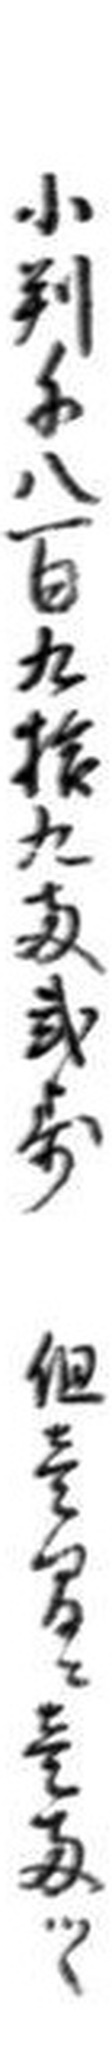小判千八百九拾九両弐歩但壱間ニ壱両ツヽ
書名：家譜 七 光通公 従寛文四年到同九年
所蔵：福井県文書館 Fukui Prefectural Archives
